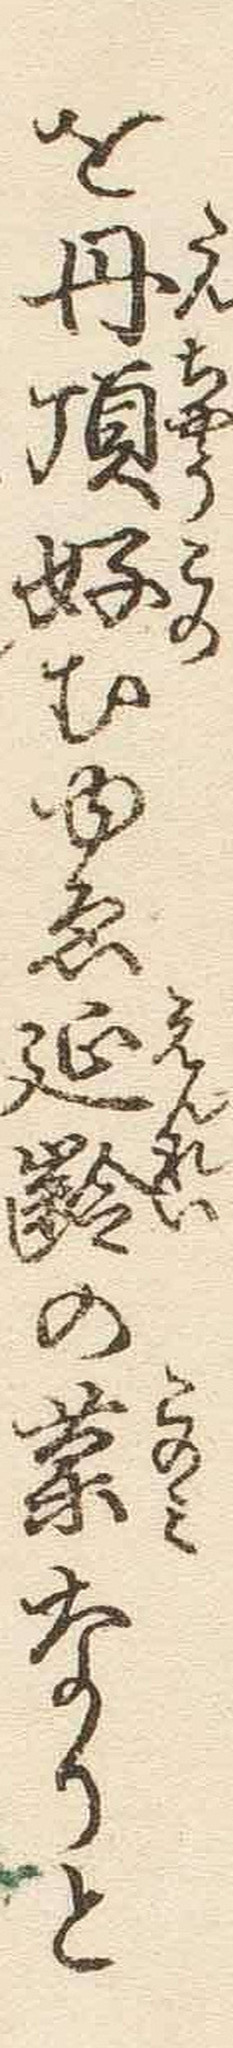を丹頂好むゆゑ延齢の菓なりと
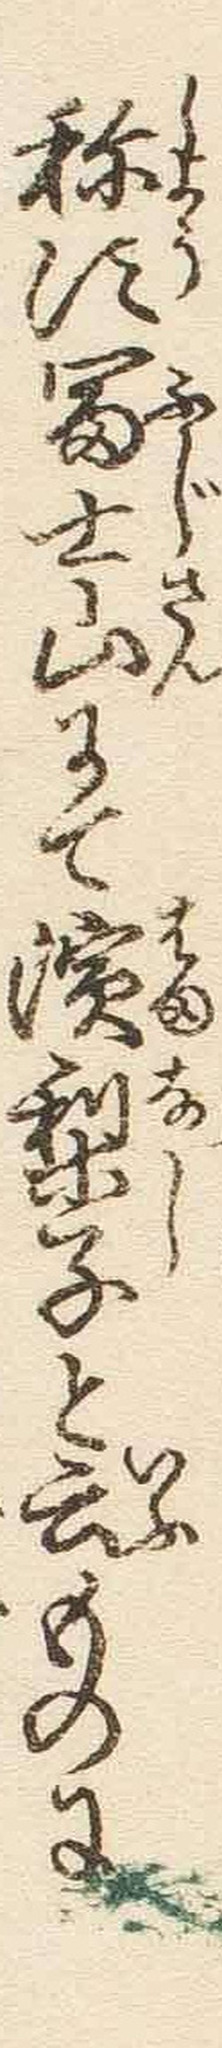称す冨士山にて濱梨子と云ものに
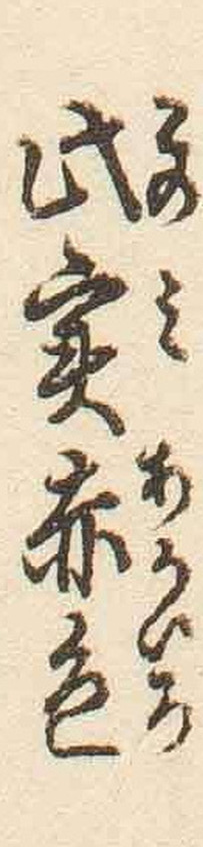此実赤色
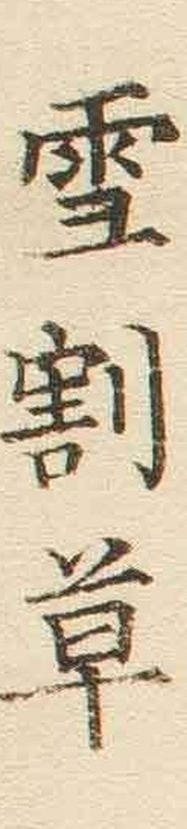雪割草
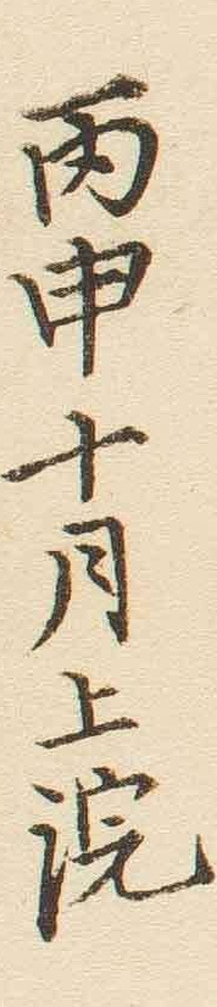丙申十月上浣
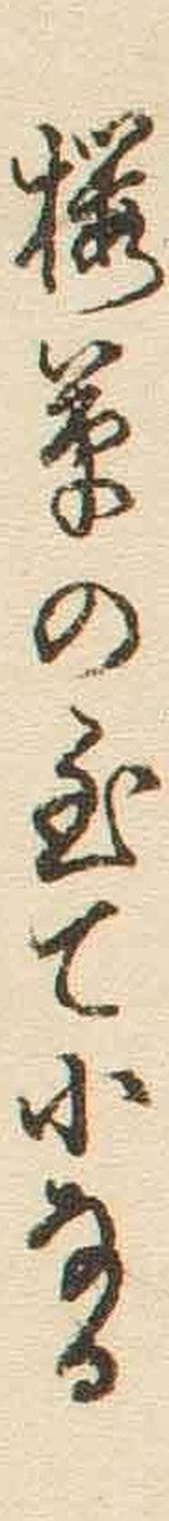桜草の至て小なる
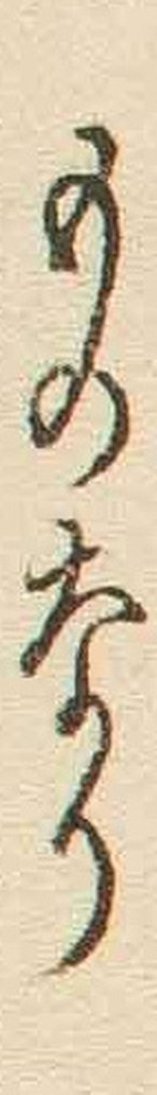ものなり

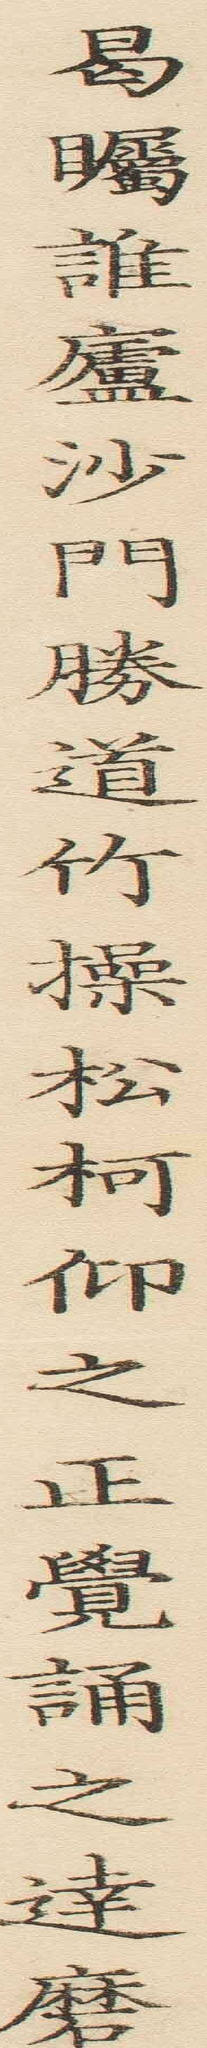曷矚誰廬沙門勝道竹操松柯仰之正覺誦之達磨
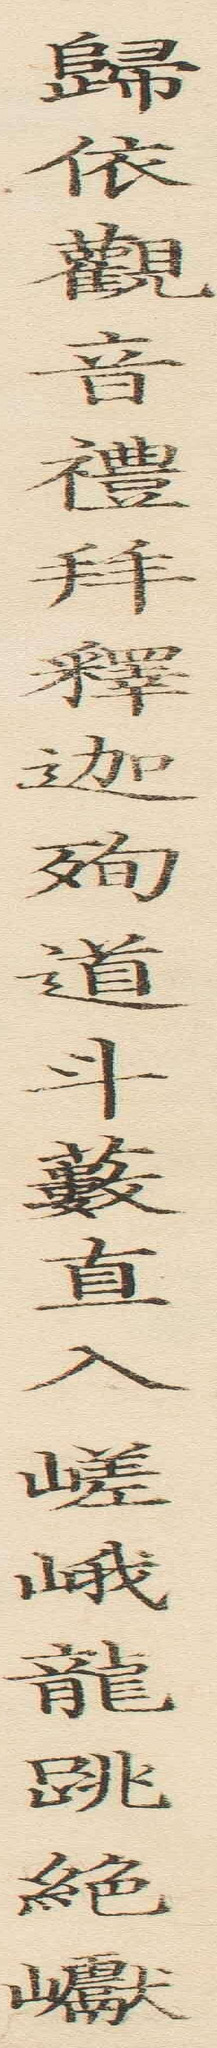歸依觀音禮拜釋迦殉道斗藪𥄂入嵯峨龍跳絶巘
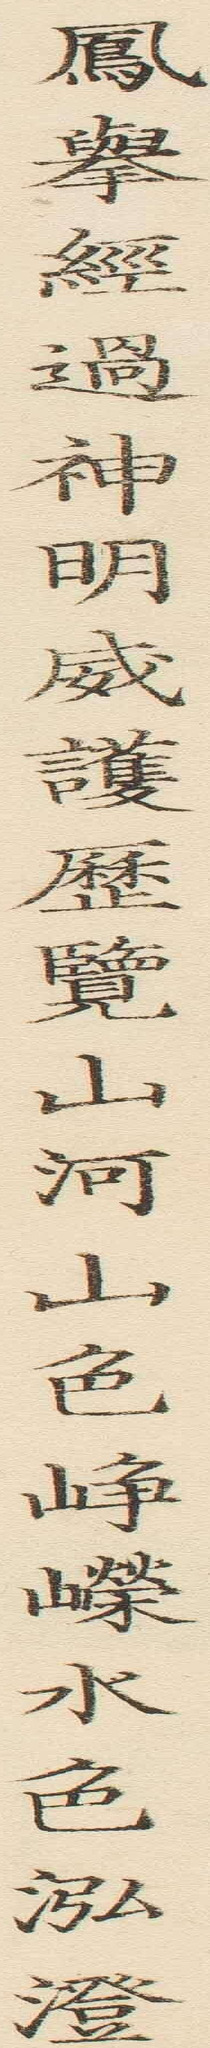鳳擧經過神明威護歷覽山河山色峥嶸水色泓澄
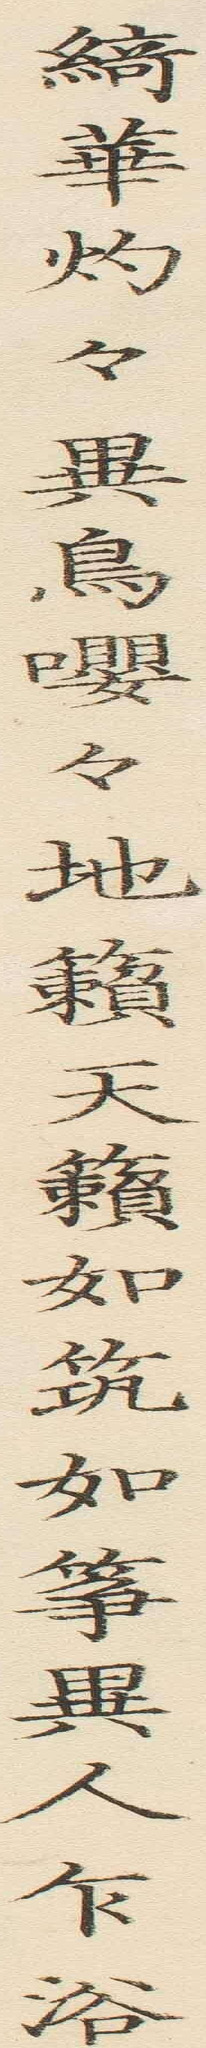綺華灼々異鳥嚶々地籟天籟如筑如筝異人乍浴
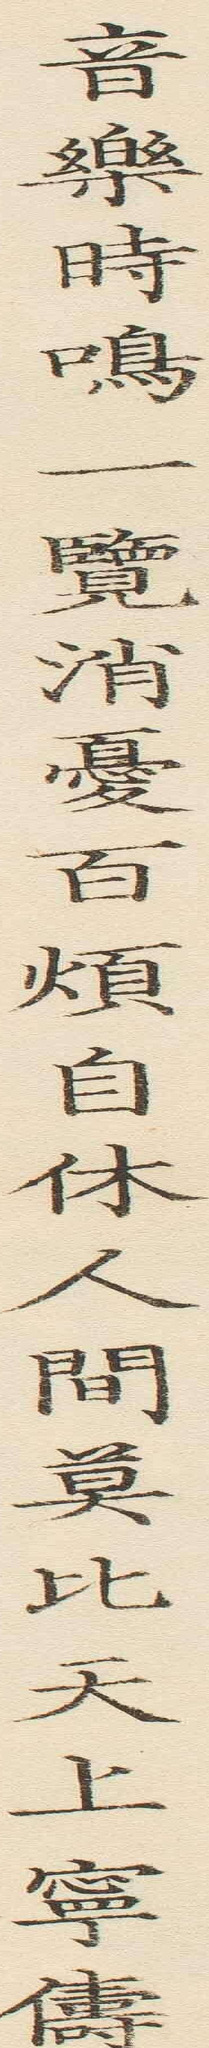音樂時鳴一覽消憂百煩自休人間莫比天上寧儔
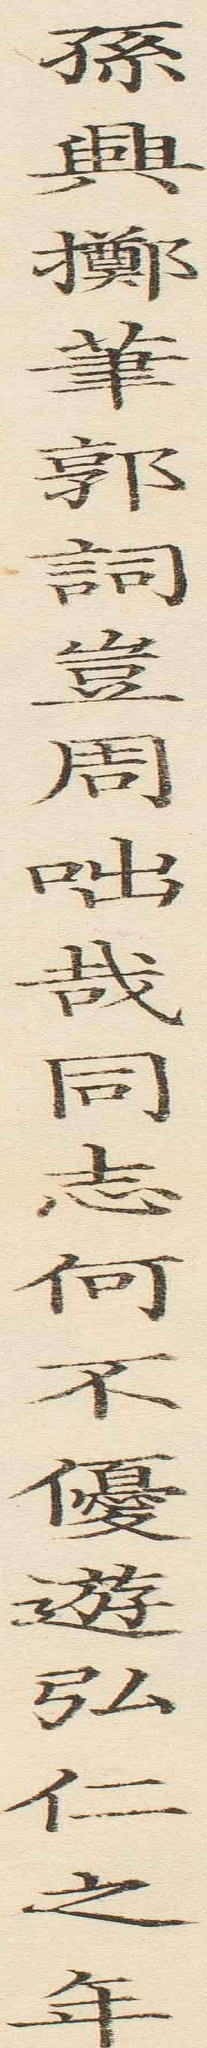孫興擲茟郭詞豈周咄哉同志何不優遊弘仁之年
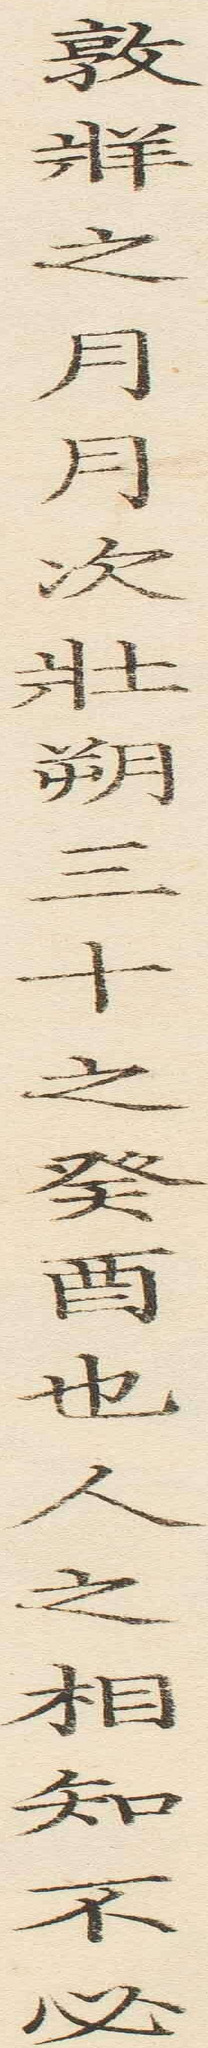敦牂之月月次壯朔三十之癸酉也人之相知不必
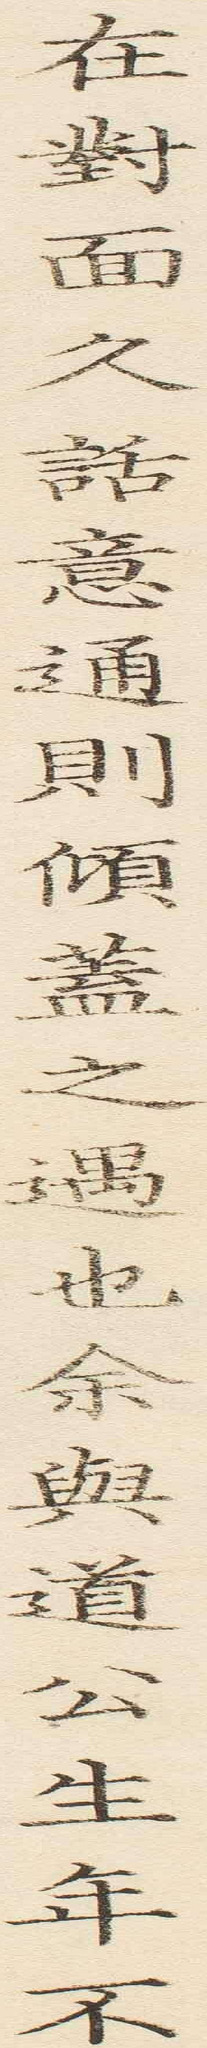在對面久話意通則傾蓋之遇也余與道公生年不
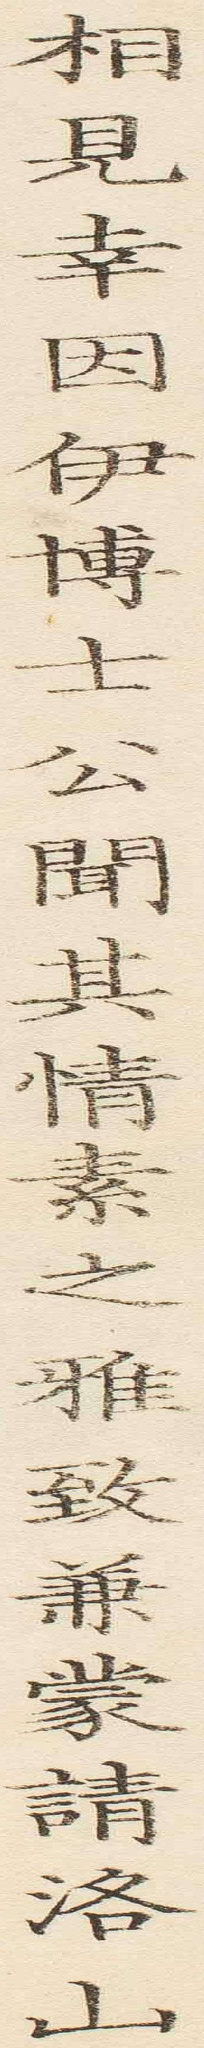相見幸因伊博士公聞其情素之雅致兼𫎇請洛山
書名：日光山志
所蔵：東京学芸大学附属図書館 国文学研究資料館
